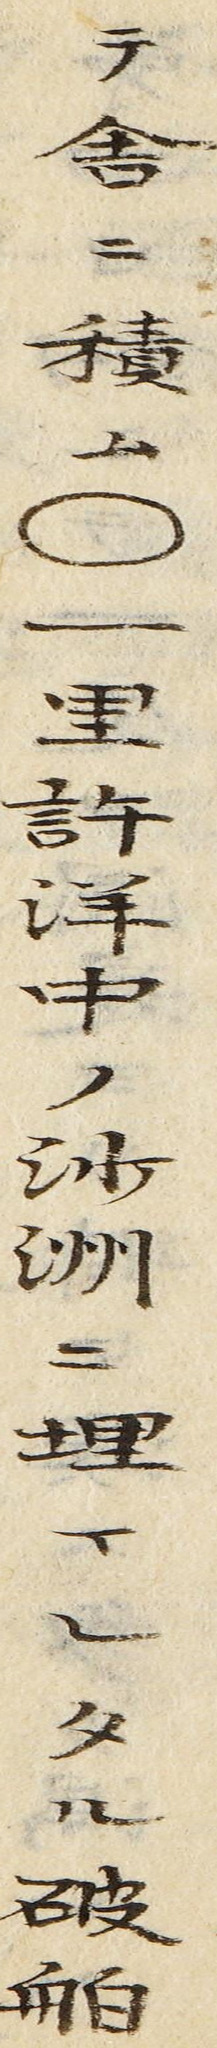テ舎ニ積ム◯一里許洋中ノ沙洲ニ埋マレタル破舶
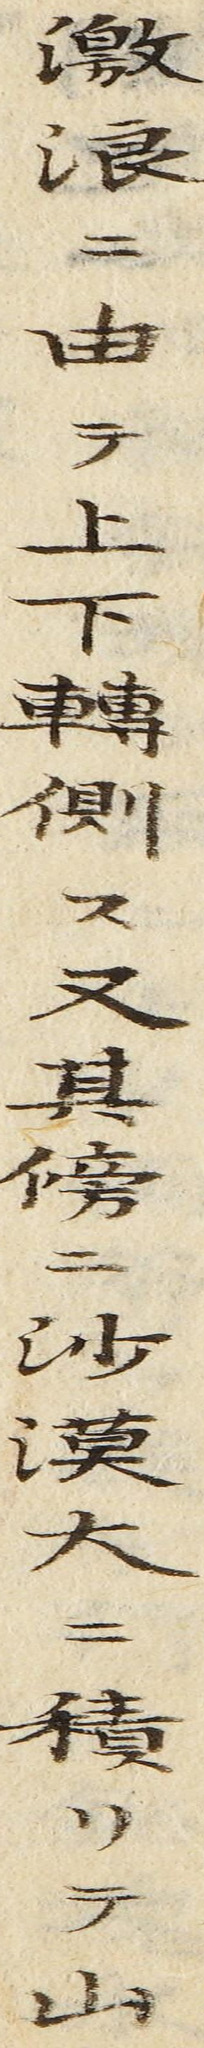激浪ニ由テ上下転側ス又其傍ニ沙漠大ニ積リテ山
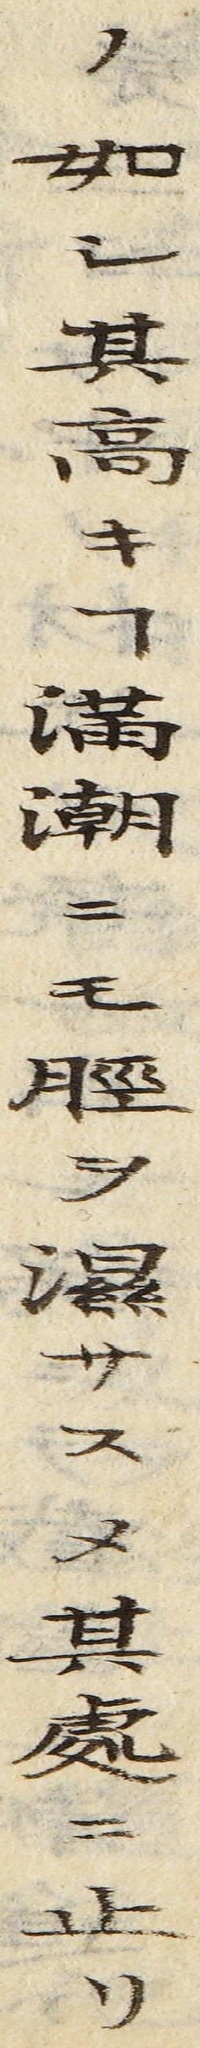ノ如シ其高キコト満潮ニモ脛ヲ湿サスシテ其処ニ止リ
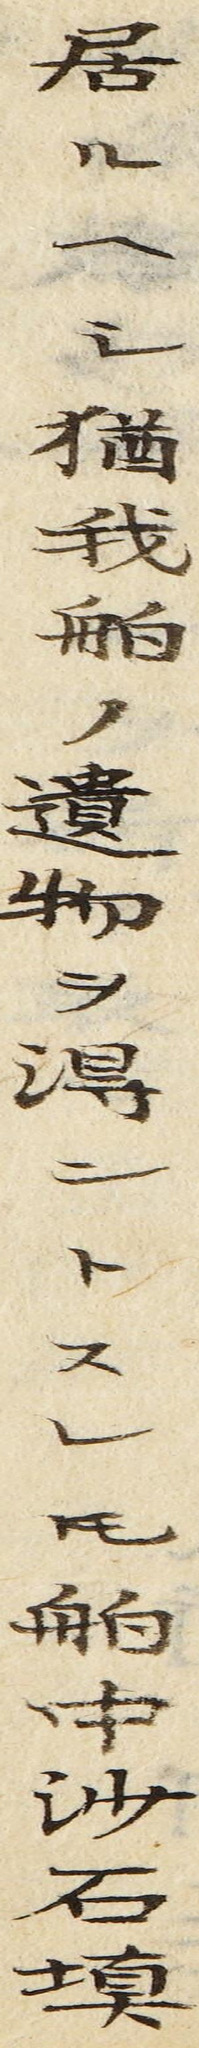居ルヘシ猶我舶ノ遺物ヲ得ントスレトモ舶中沙石填
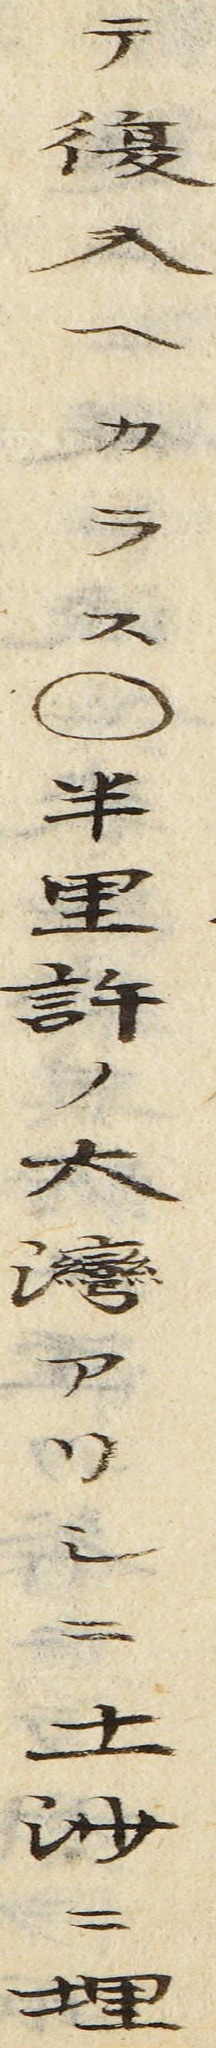テ復入ヘカラス◯半里許ノ大湾アリシニ土沙ニ埋
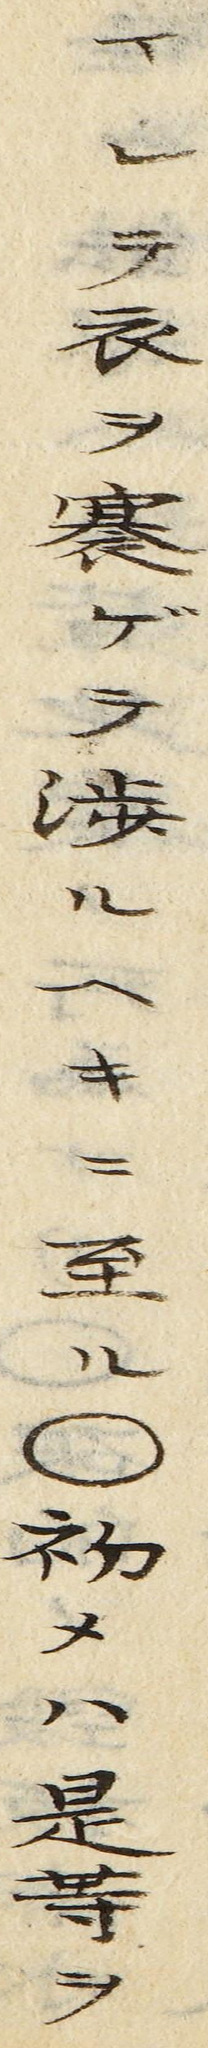マレテ衣ヲ褰ゲテ渉ルヘキニ至ル◯初メハ是等ヲ

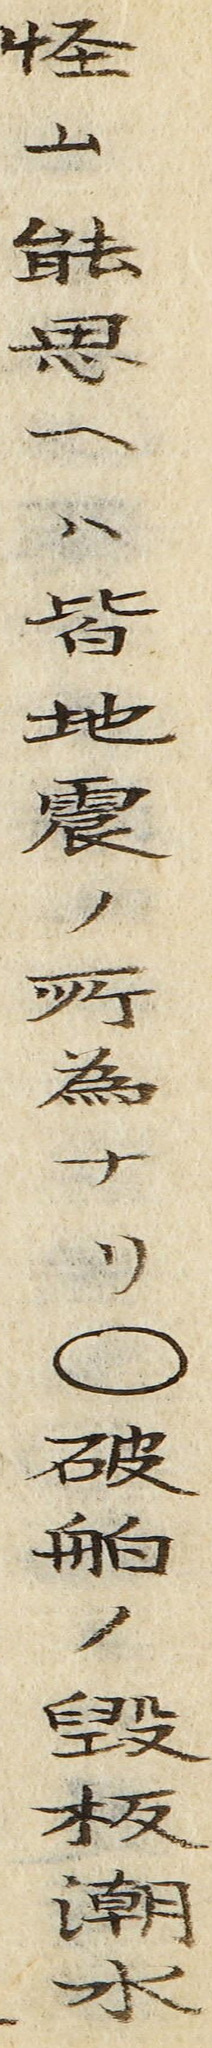怪ム能思ヘハ皆地震ノ所為ナリ◯破舶ノ毀板潮水
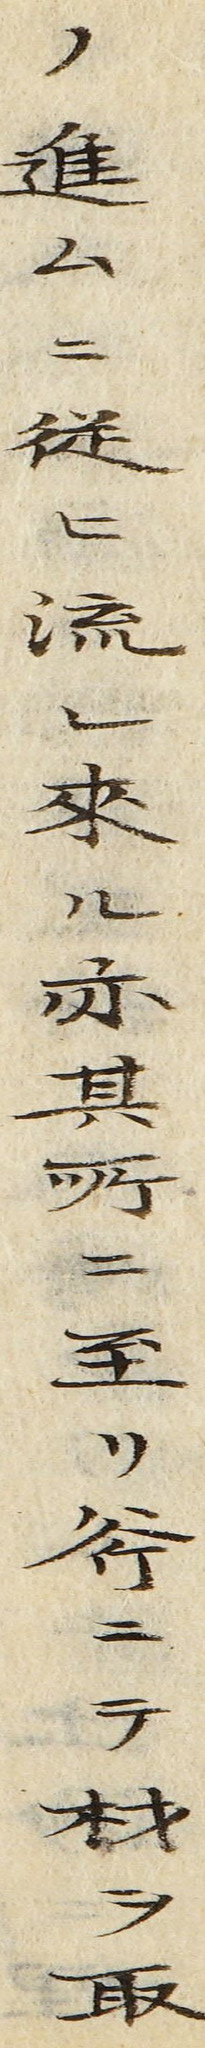ノ進ムニ従ヒ流レ来ル亦其所ニ至リ斧ニテ材ヲ取
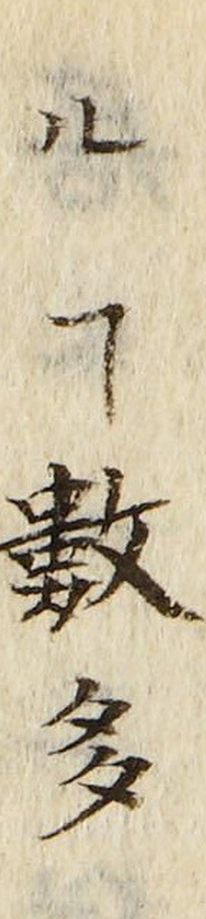ルコト数多
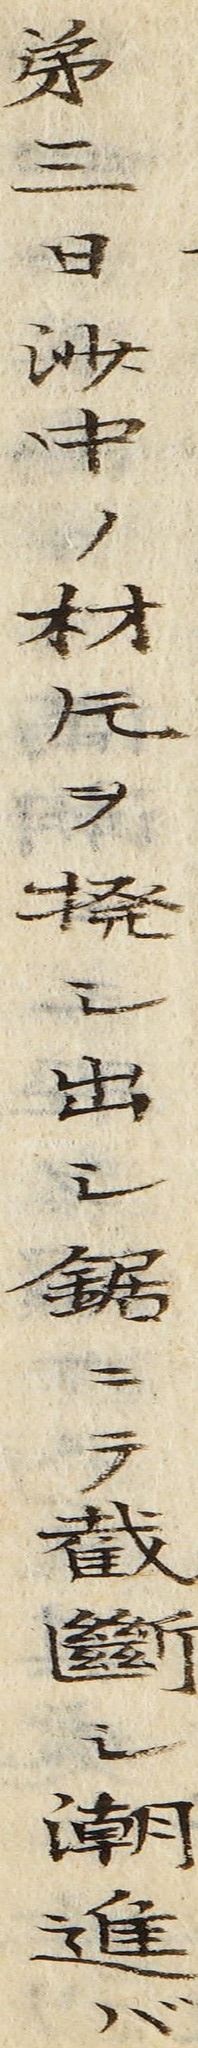第三日沙中ノ材片ヲ撥シ出シ鋸ニテ截断シ潮進バ
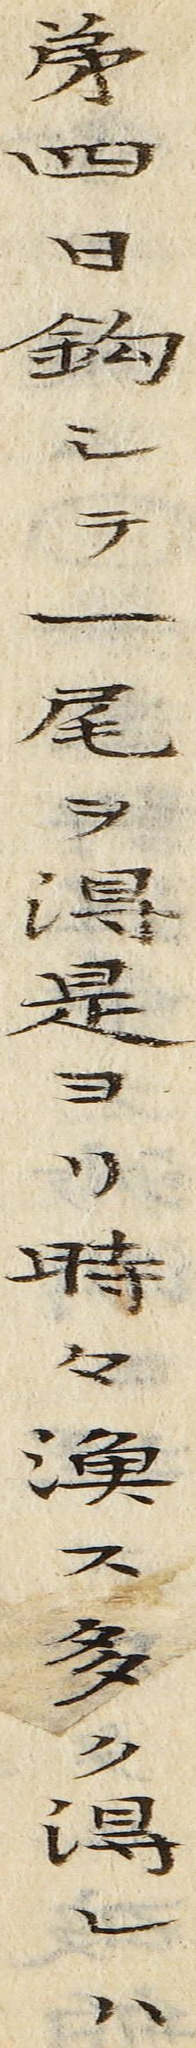第四日釣シテ一尾ヲ得是ヨリ時々漁ス多ク得レハ
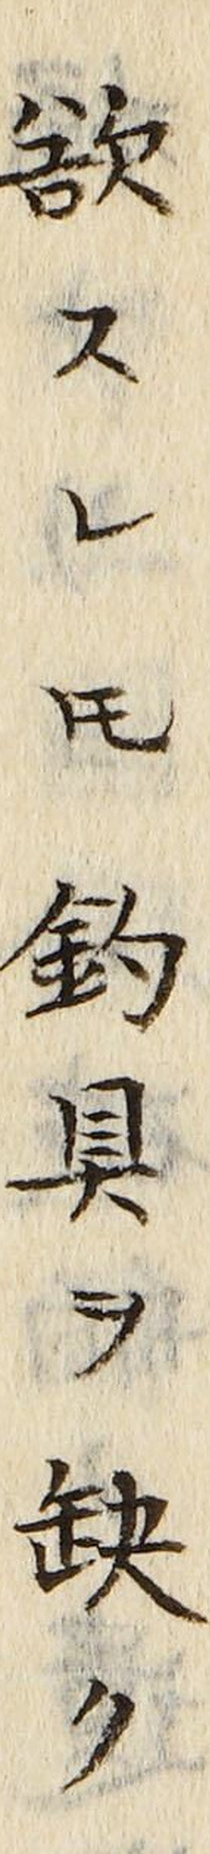欲スレトモ釣具ヲ欠ク
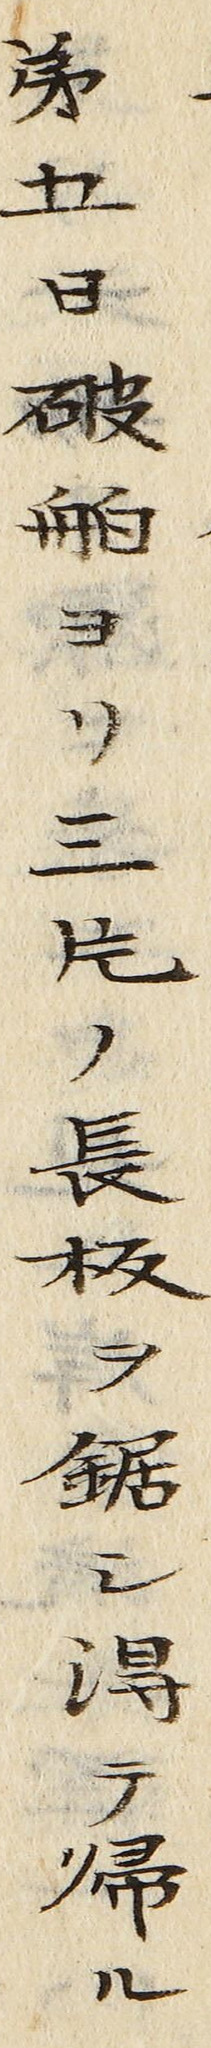第五日破舶ヨリ三片ノ長板ヲ鋸シ得テ帰ル
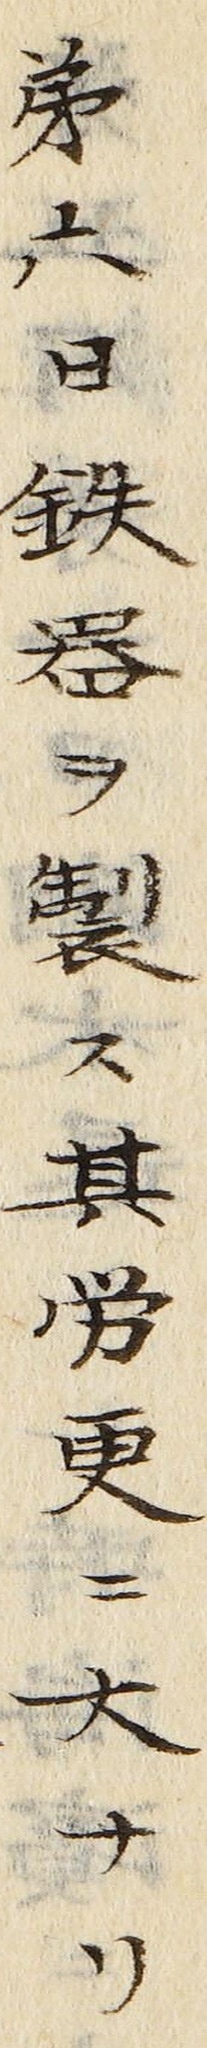第六日鉄器ヲ製ス其労更ニ大ナリ
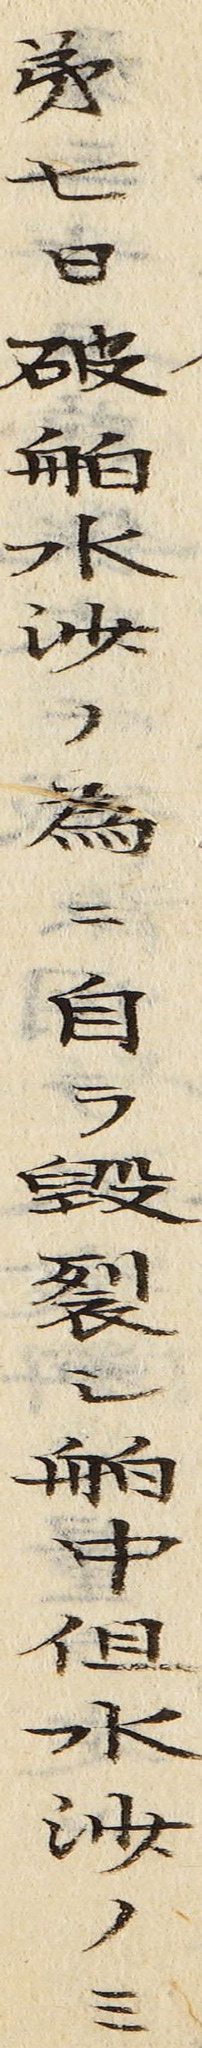第七日破舶水沙ノ為ニ自ラ毀裂シ舶中但水沙ノミ
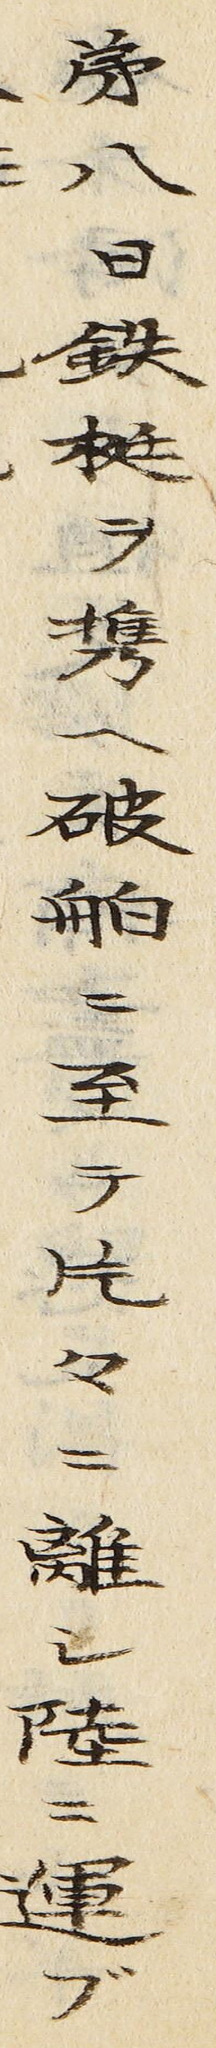第八日鉄梃ヲ携ヘ破舶ニ至テ片々ニ離シ陸ニ運ブ
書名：漂流紀事
